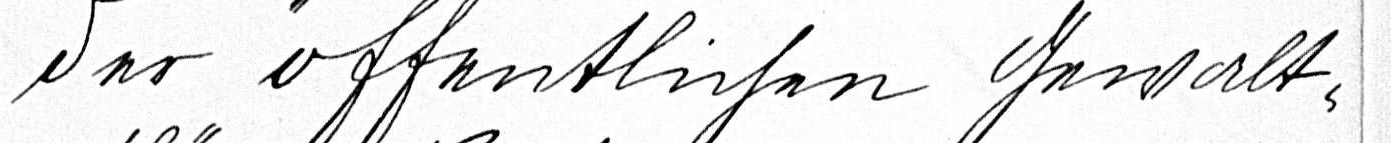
der öffentlichen Gewalt¬
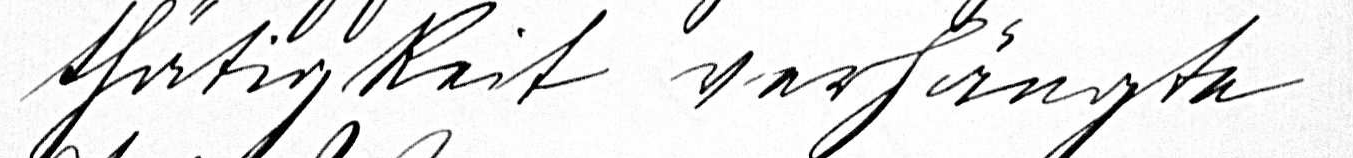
thätigkeit verhängte
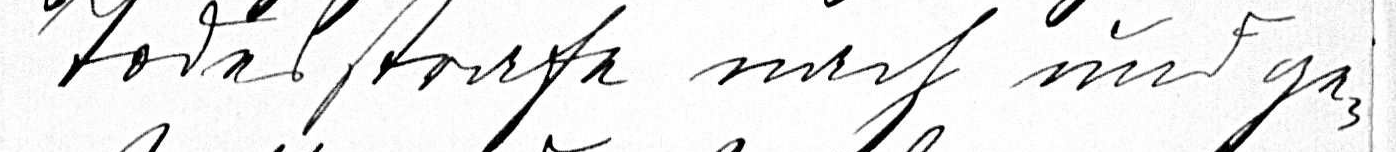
Todesstrafe nach und ge¬
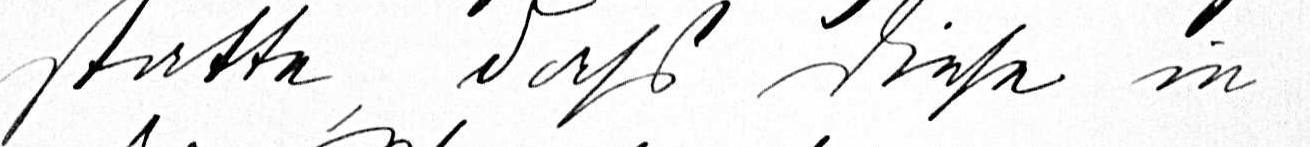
statte, daß diese in
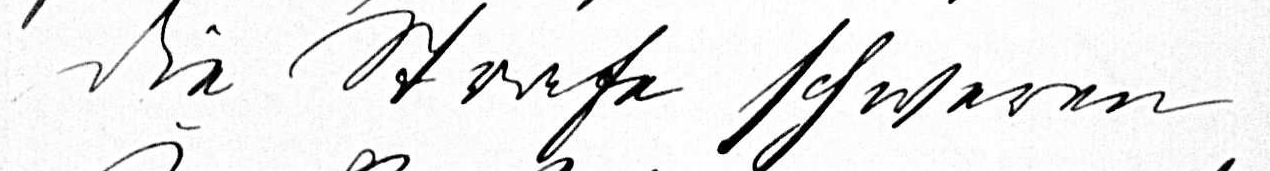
die Strafe schweren
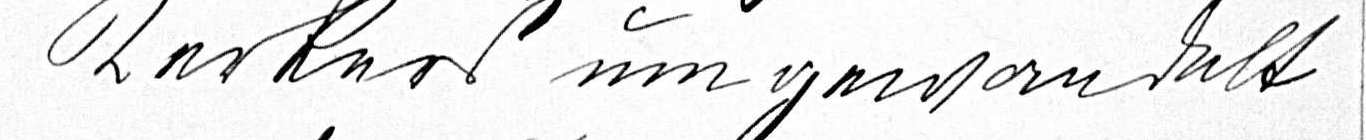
Kerkers umgewandelt
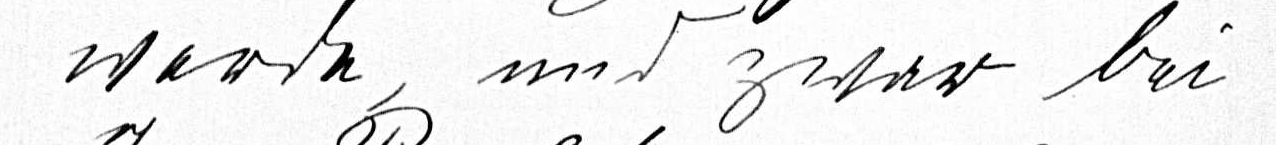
werde und zwar bei
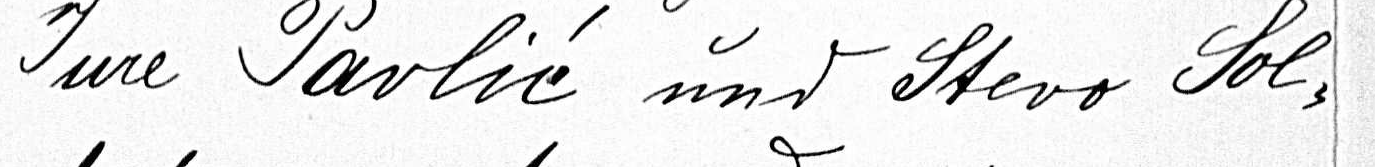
Jure Pavlić und Stevo Sol¬
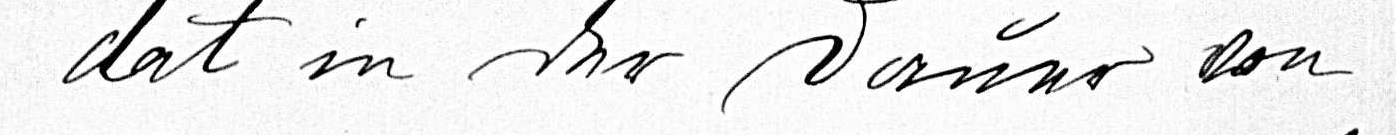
dat in der Dauer von
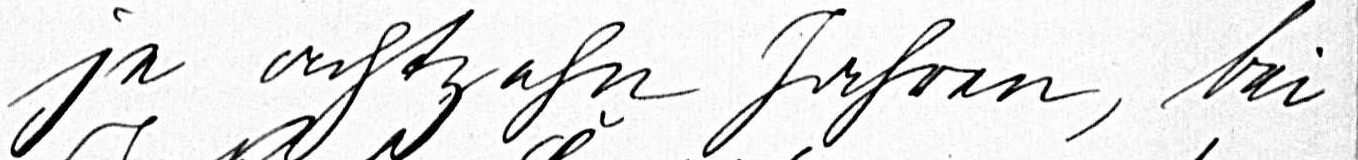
je achtzehn Jahren, bei
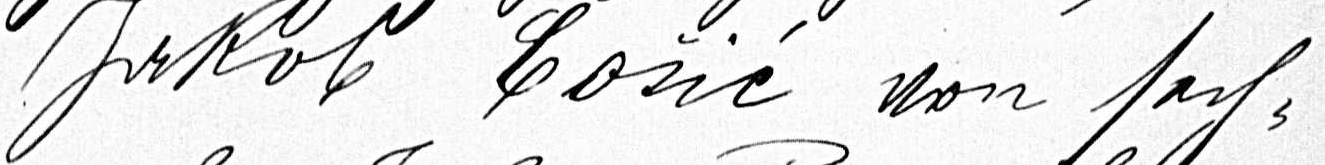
Jakob Čošić von sech¬
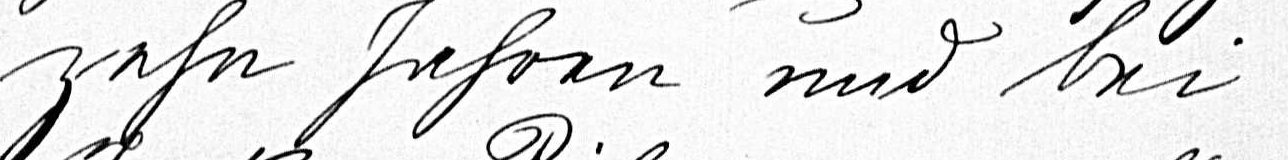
zehn Jahren und bei
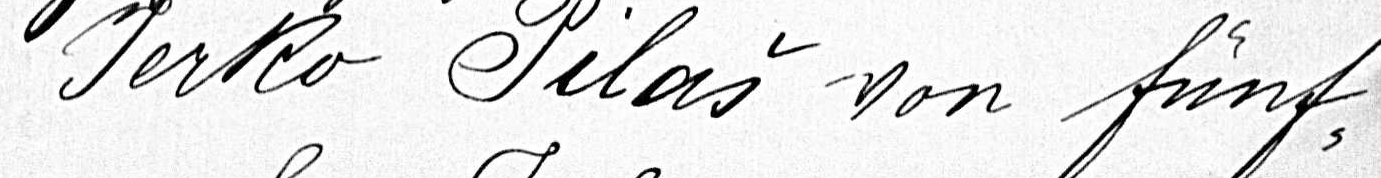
Jerko Pilaš von fünf¬
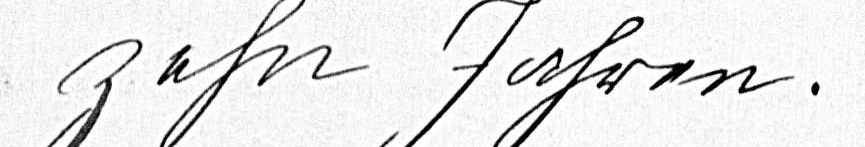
zehn Jahren.
